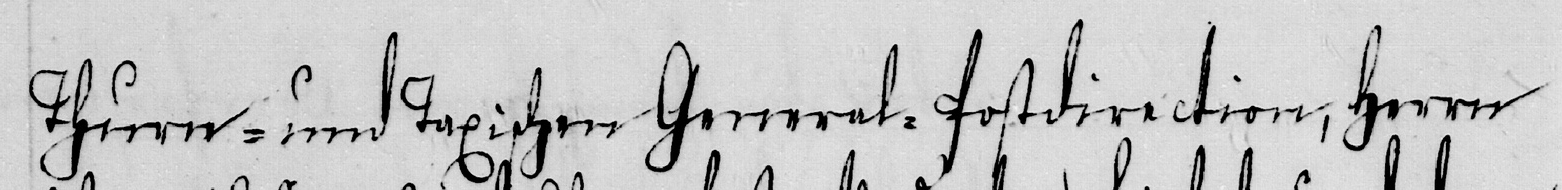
Thurn- und Taxischen General-Postdirection, Herren
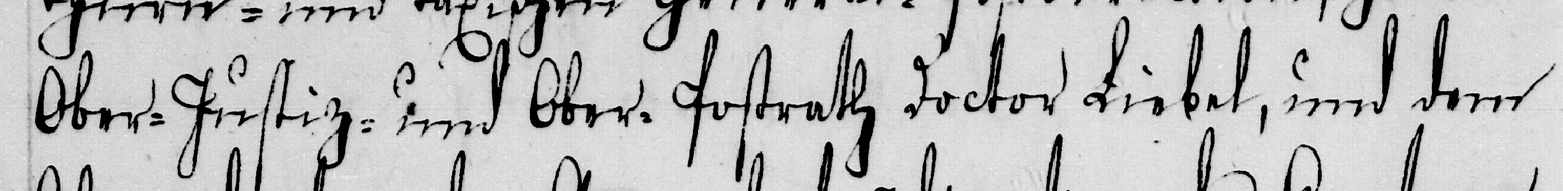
Ober-Justiz- und Ober-Postrath Doctor Liebel, und dem
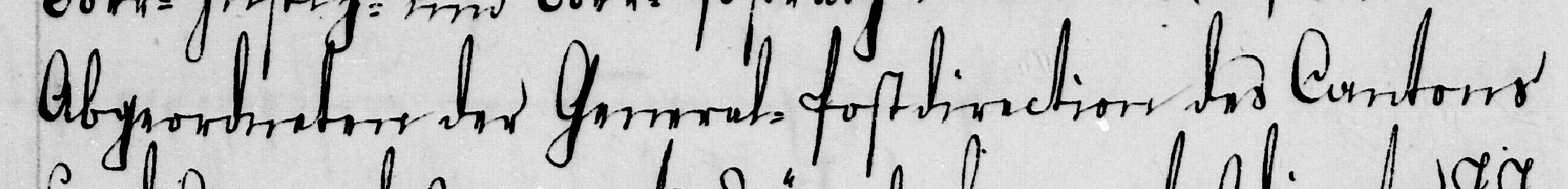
Abgeordneten der General-Postdirection des Cantons
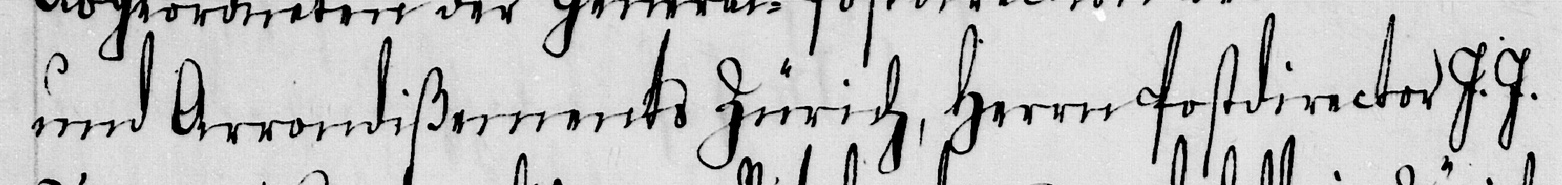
und Arrondißements Zürich, Herrn Postdirector J. J.
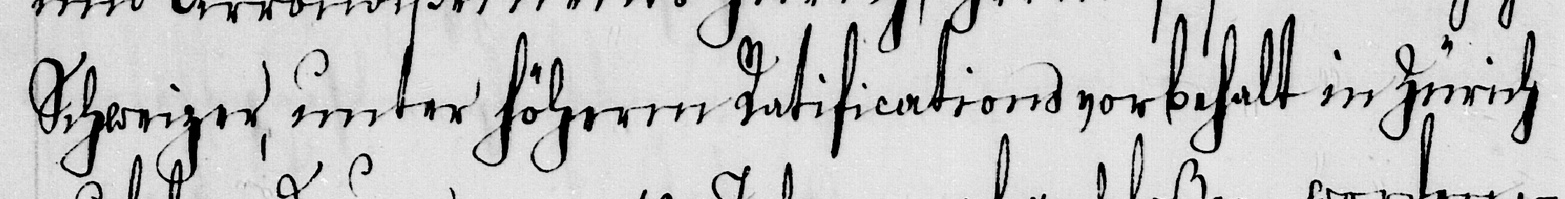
Schweizer, unter Höherm Ratificationsvorbehalt in Zürich
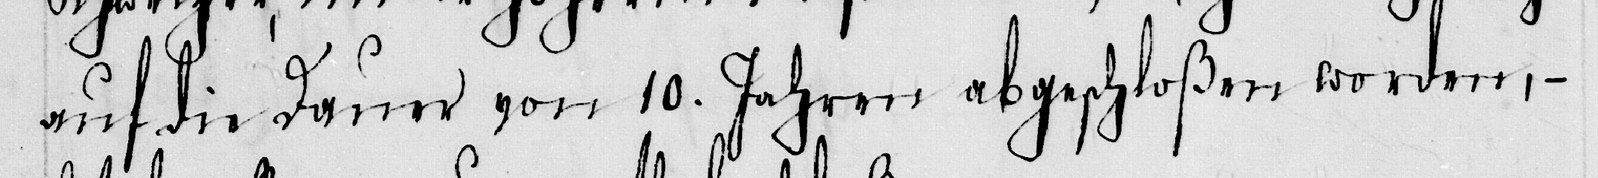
auf die Dauer von 10. Jahren abgeschloßen worden, –
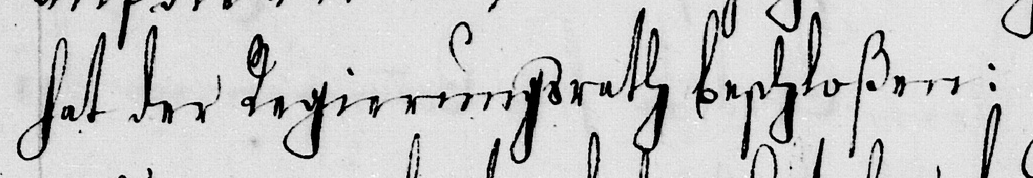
hat der Regierungsrath beschloßen:
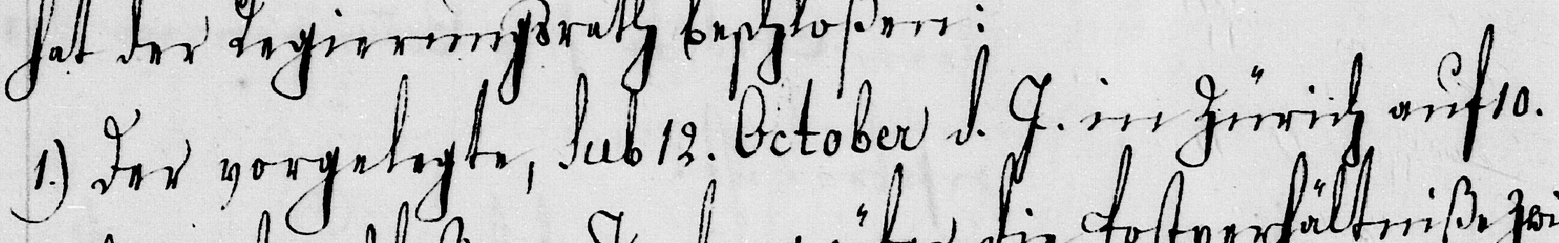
1.) Der vorgelegte, sub 12. October d. J. in Zürich auf 10.
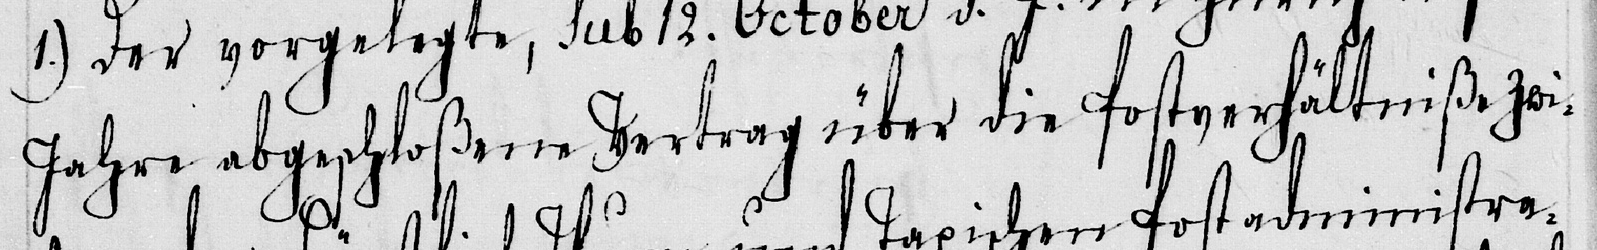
Jahre abgeschloßene Vertrag über die Postverhältniße zwi¬
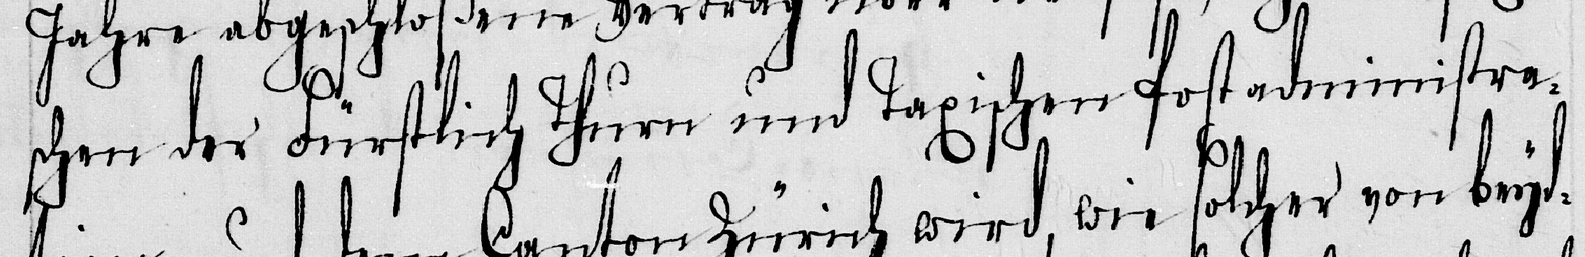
schen der Fürstlich Thurn und Taxischen Postadministra¬
